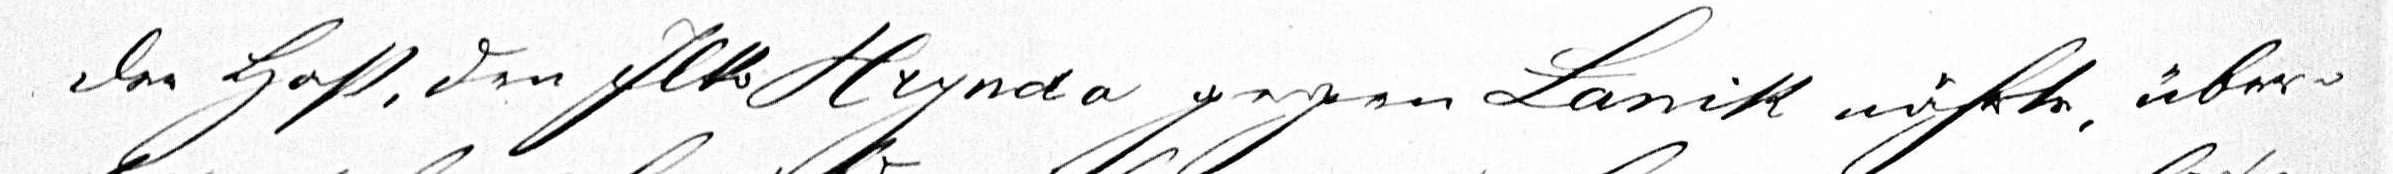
Der Haß, den Jlko Hrynda gegen Lanik nährte, über¬
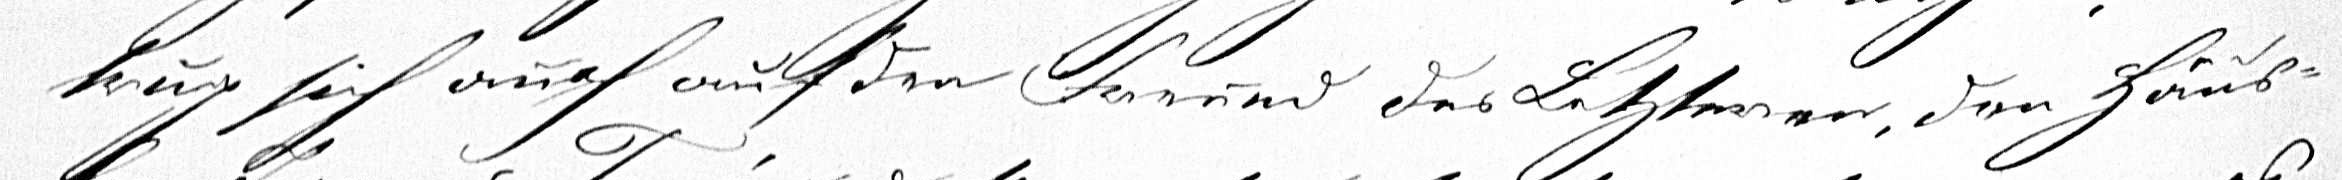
trug sich auch auf den Freund des Letzeren, den Häus¬
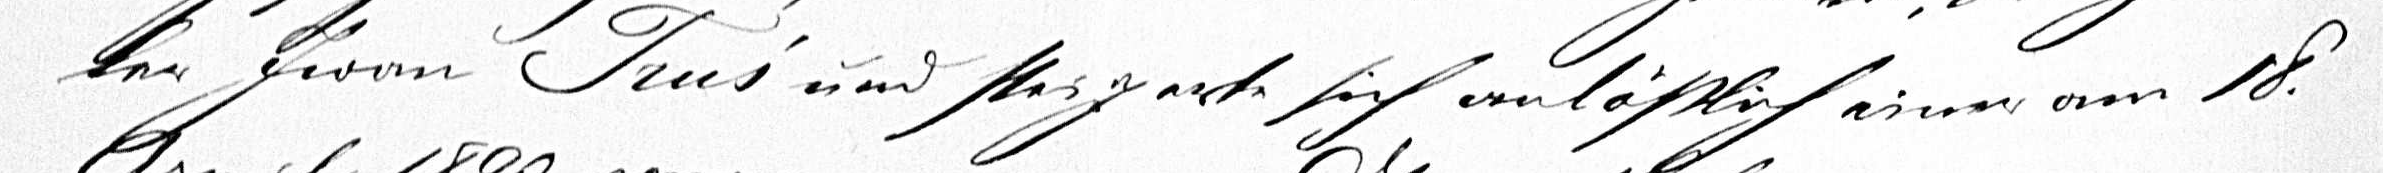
ler Jwan Tru's und steigerte sich anläßlich einer am 18.
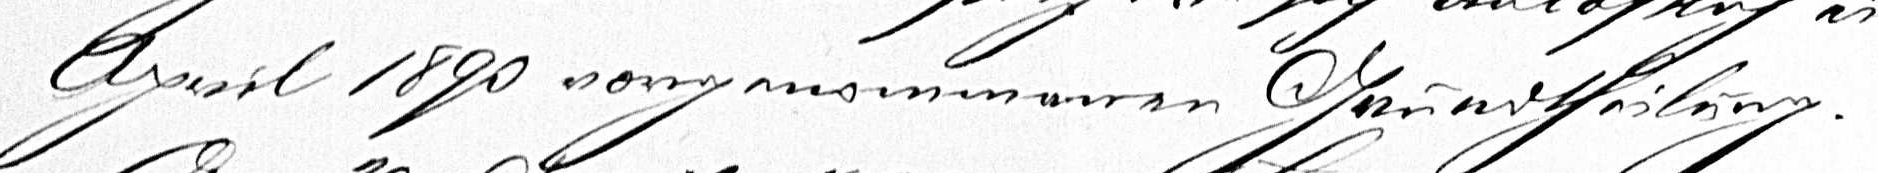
April 1890 vorgenommenen Grundtheilung.
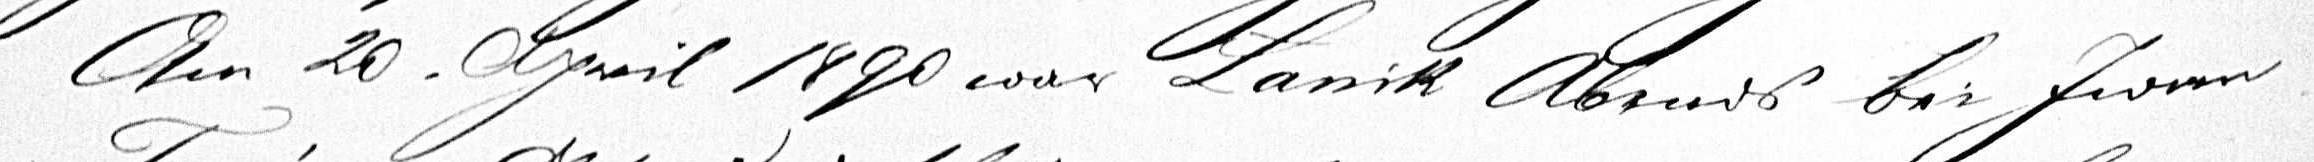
Am 20. April 1890 war Lanik Abends bei Jwan
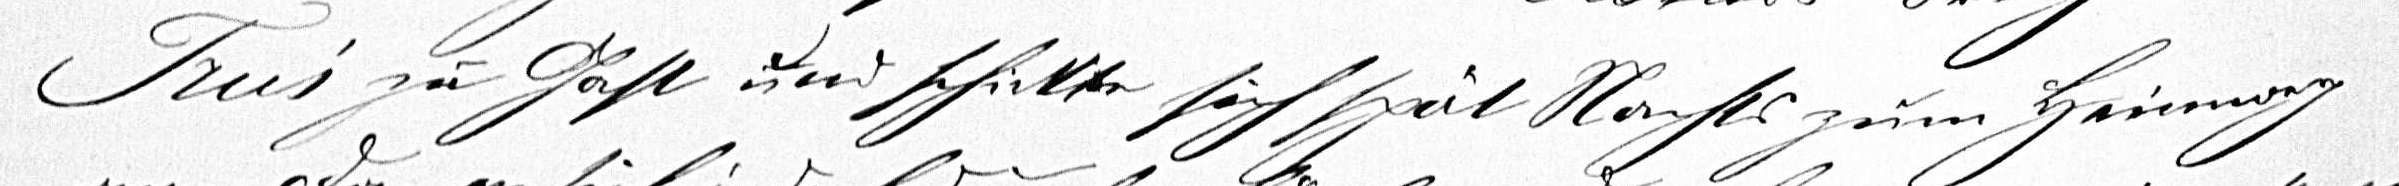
Tru's zu Gast und schickte sich spät Nachts zum Heimweg
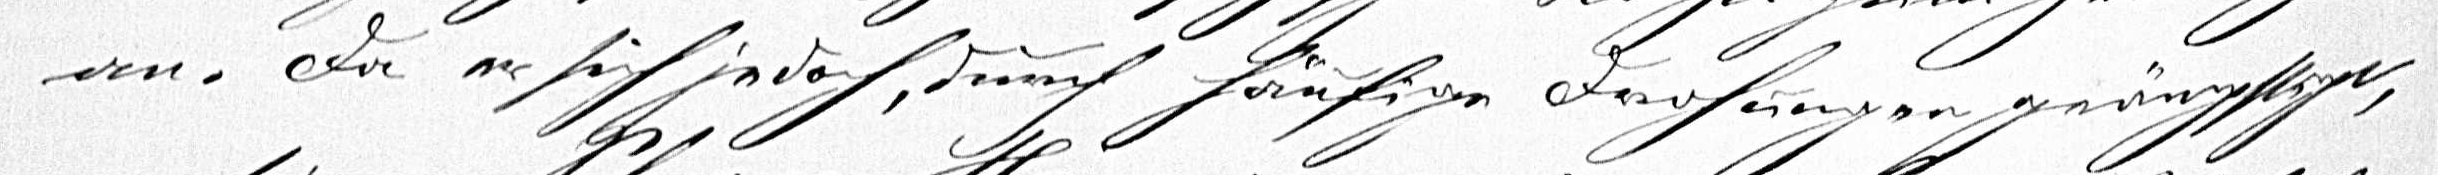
an. Da er sich jedoch, durch häufige Drohungen geäxx,
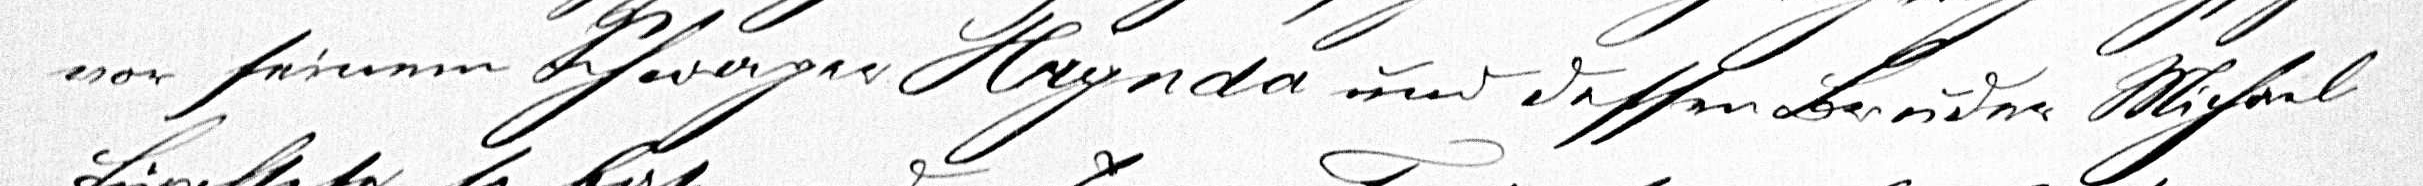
vor seinem Schwager Hrynda und dessen Bruder Michael
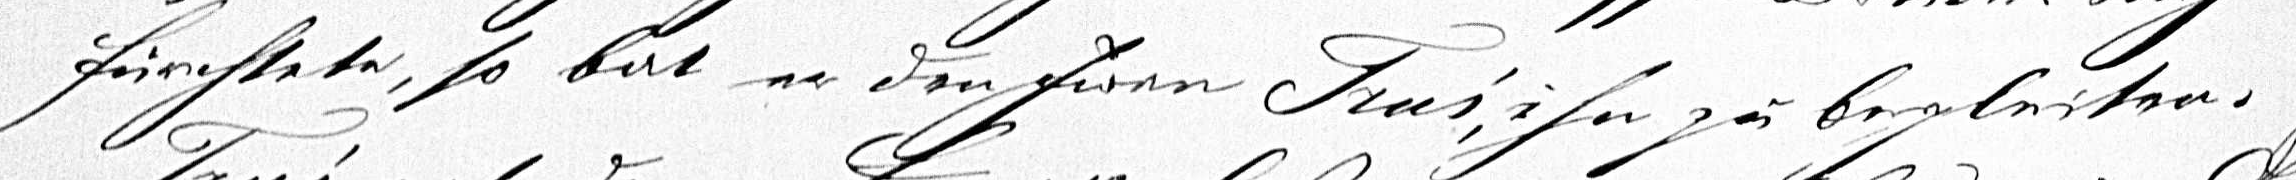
fürchtete, so bat er den Jwan Tru's, ihn zu begleiten.
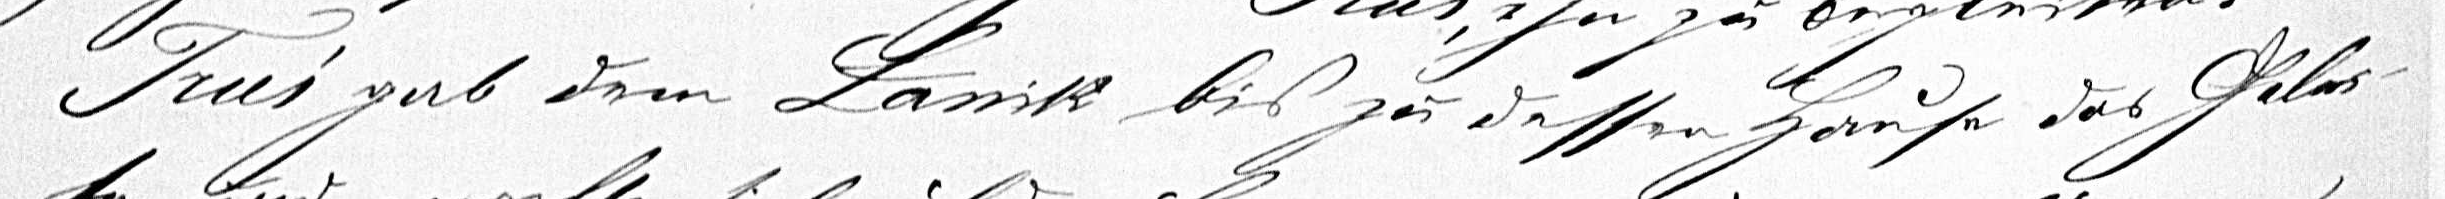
Tru's gab dem Lanik bis zu dessen Hause das Gelxx¬
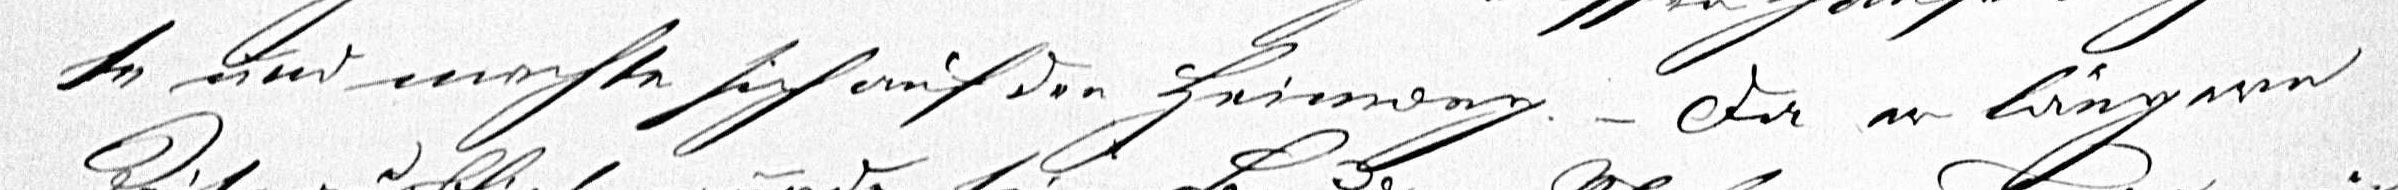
te und machte sich auf den Heimweg. - Da er längere
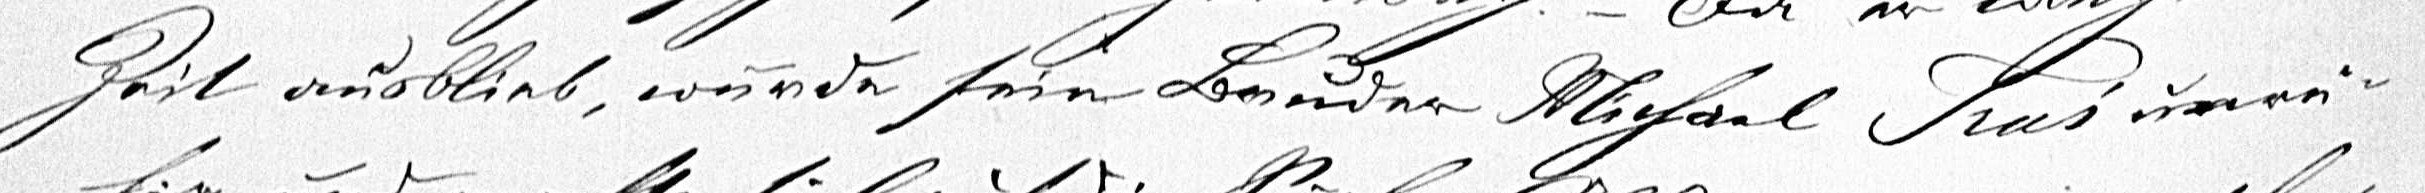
Zeit ausblieb, wurde sein Bruder Michael Tru's unru¬
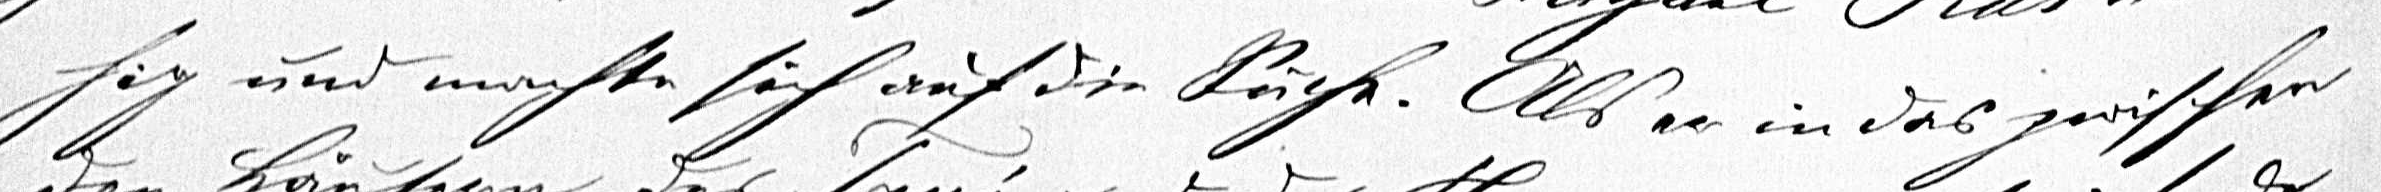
hig und machte sich auf die Suche. Als er in das zwischen
